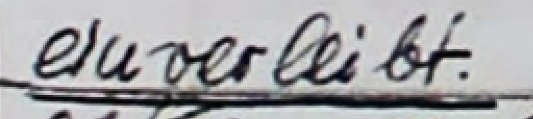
einverleibt.
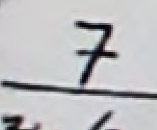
7
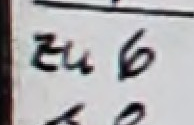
zu 6
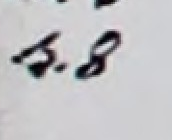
s. 8
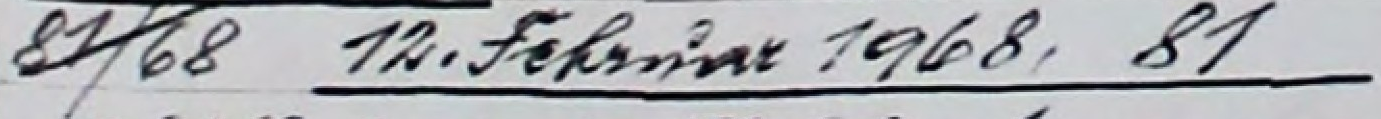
81/68 12. Februar 1968, 81
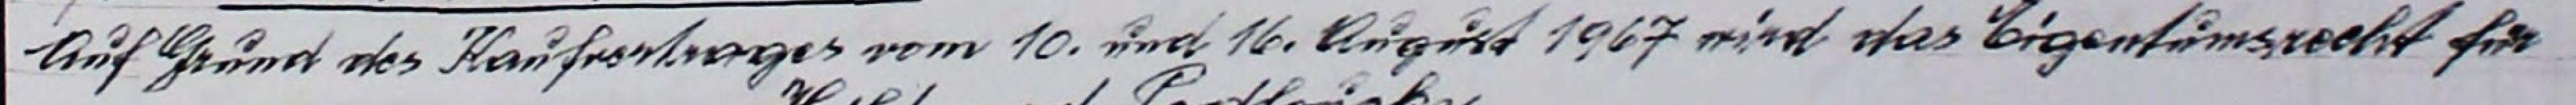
Auf Grund des Kaufvertrages vom 10. und 16. August 1967 wird das Eigentumsrecht für
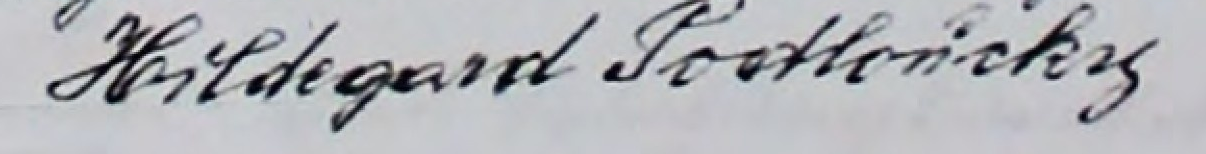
Hildegard Podloucky
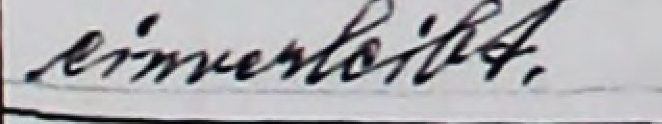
einverleibt.
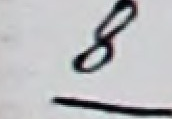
8
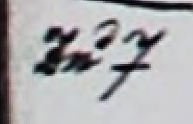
Zu 7
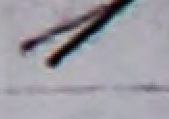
1
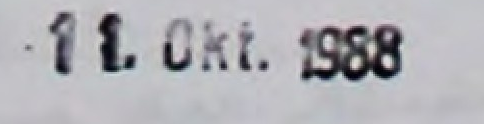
11. Okt. 1988
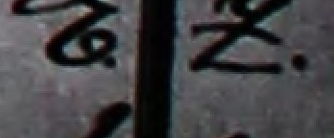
E Z.
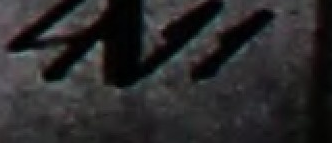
411
